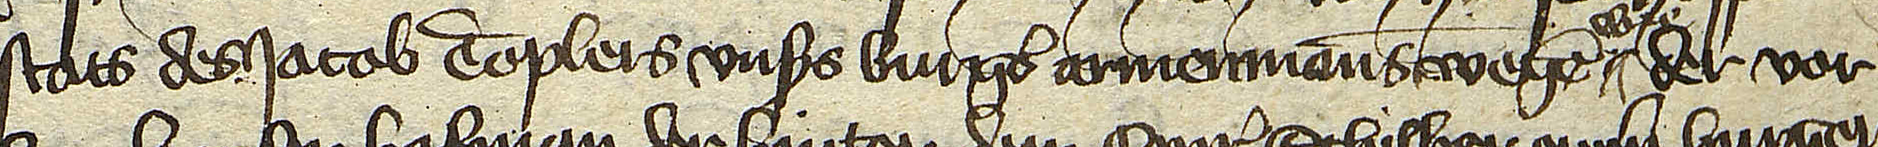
ſtats des Iacob Toplers vnſ*s burgs* armenmans wege* / der vor
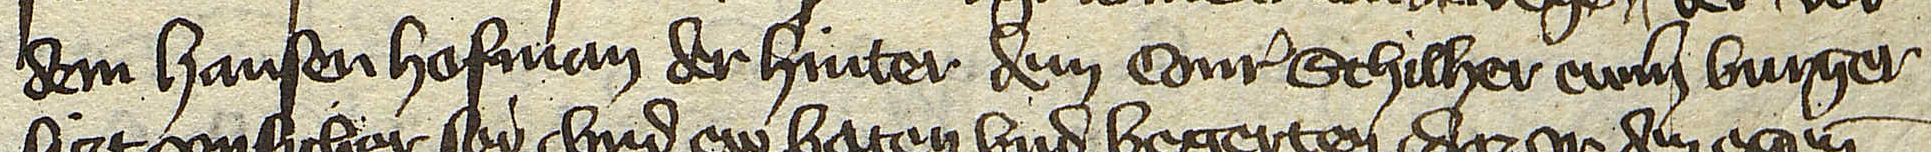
dem hanſen hofman der hinter dem Conr* Schilher ewm* burger
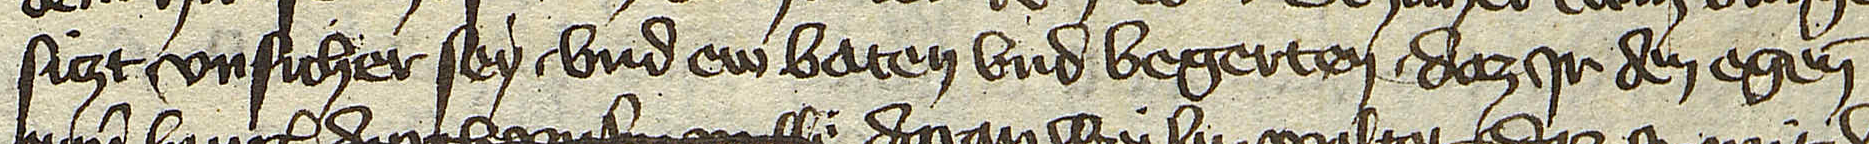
ſicʒt vnſicher ſey / vnd ew baten vnd begerten / daʒ Ir den egen*
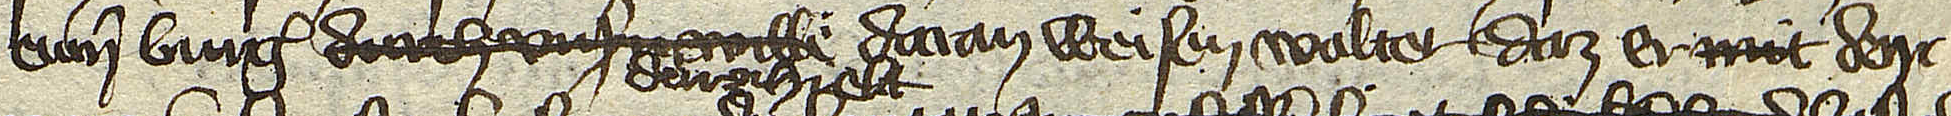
ewn* burg* durch vnſ*n wille daran weiſen woltet / daʒ Er mit den
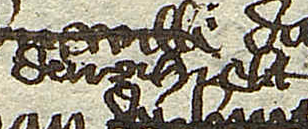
dar%%%%%%
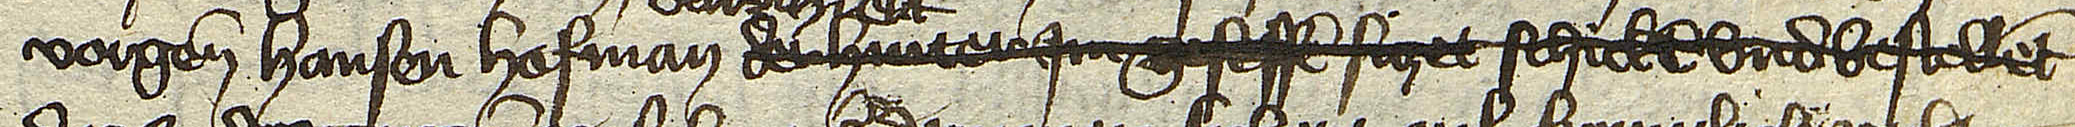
vorgen* hanſen hofman der hinter Im geſeſſe* ſicʒet ſchicke* vnd beſtellet
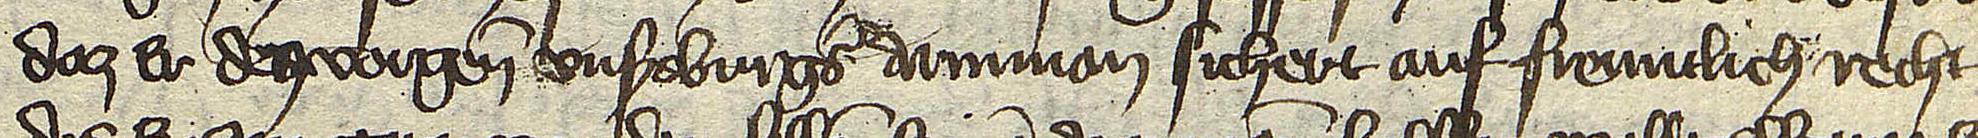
daʒ Er den vorgen* vnſ*s burgs* Armman ſichert auf freuntlich recht
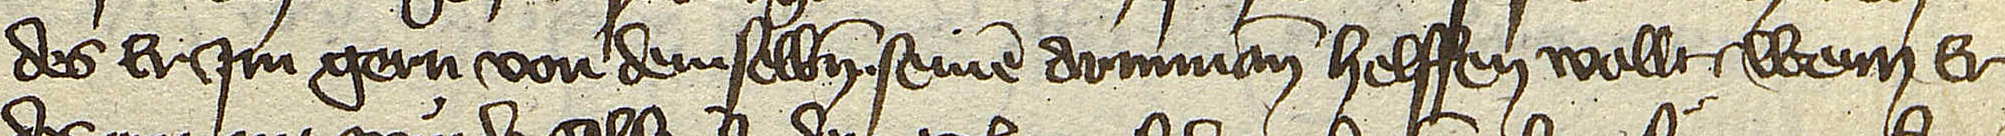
des Er Im gern von dem ſelbn* ~ ſeine* Armman* helffen wollt / wenn Er
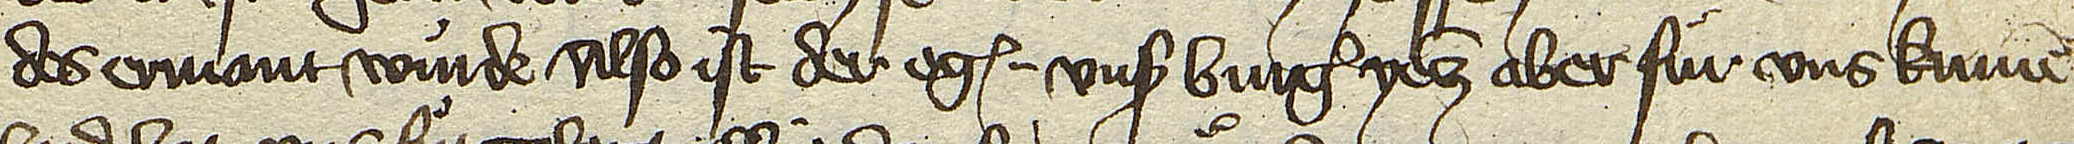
des ermant würde / Alſo iſt der eg* ~ vnſ* burg* yecʒ* aber für vns kume*
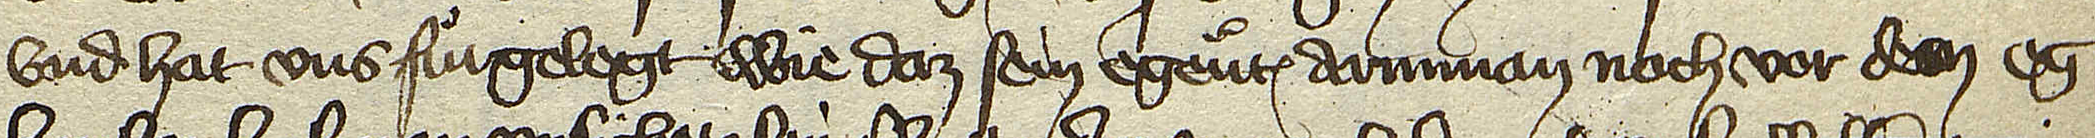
vnd hat vns fürgelegt wie daʒ ſein egen*t* Armman noch vor dem eg*
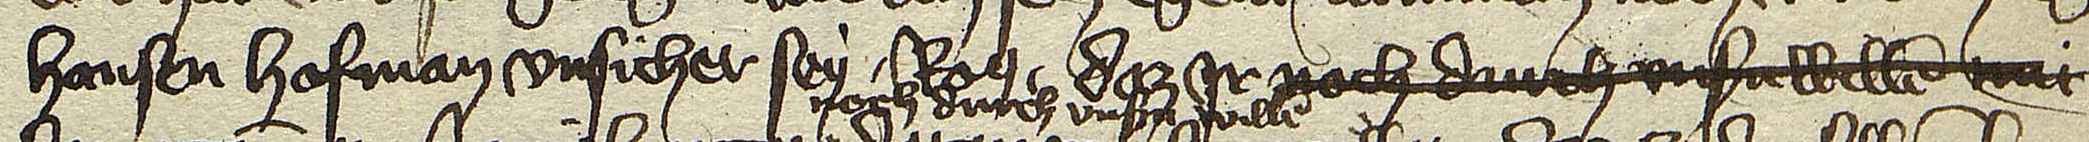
hanſen hofman vnſicher ſey / Ro* / daʒ Ir noch durch vnſ*n wille* mit
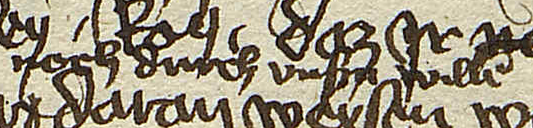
noch durch vnſ*n wille*
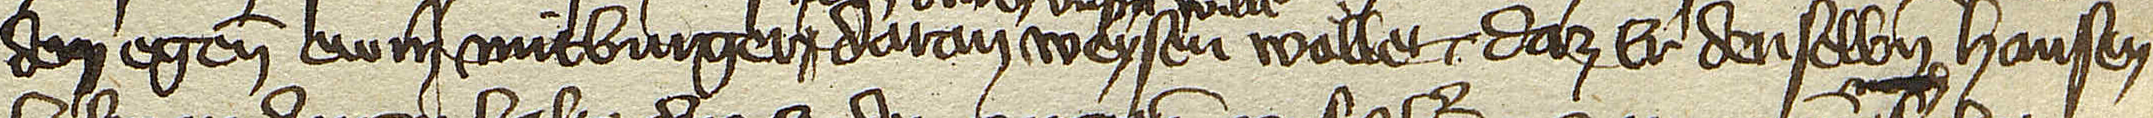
dem egen* ewm* mitburger daran weyſen wöllet / daʒ Er denſelbn* hanſen
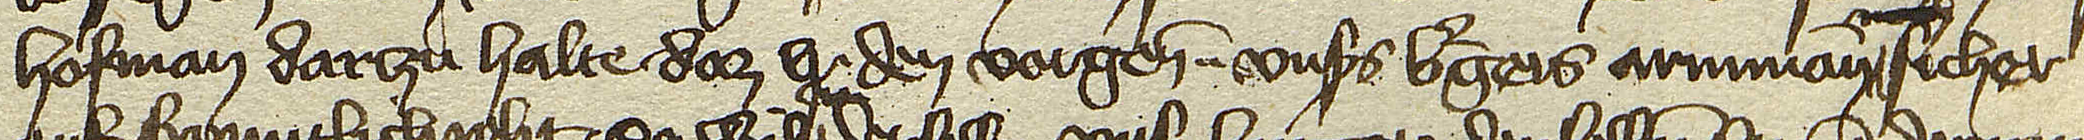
hofman darcʒu halte / daʒ Er den vorgen* ~ vnſ*s B*gers armman* ſicher
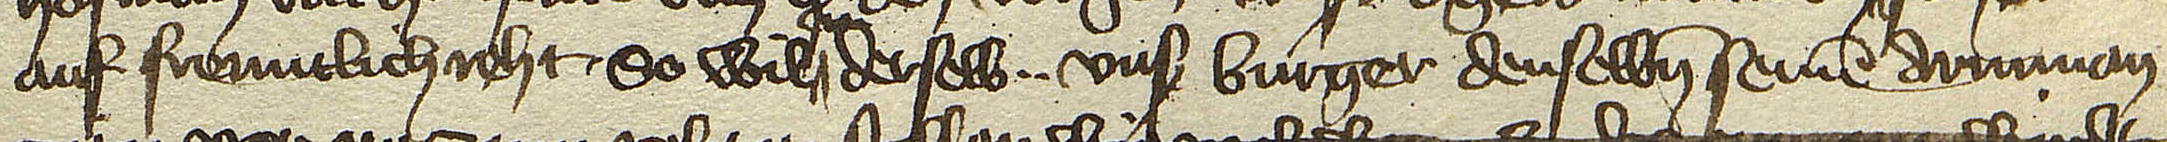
auf freuntlich reht / So wil derſelb ~ vnſ* burger denſelbn* ſeine* Armman
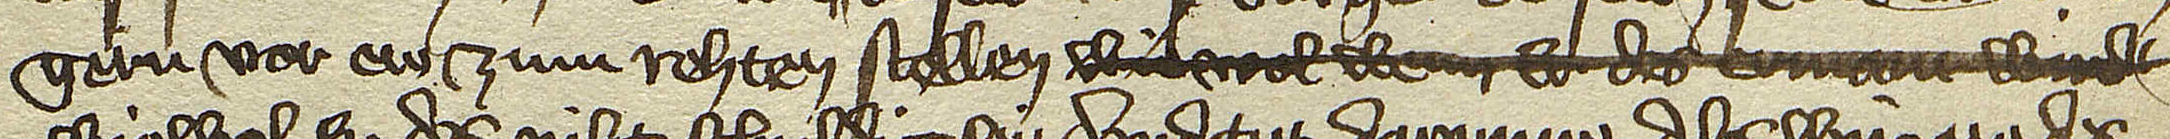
gern vor ew cʒum rehten ſtellen wie wol wenn Er des ermant wirdt
